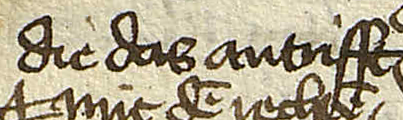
die das antrifft
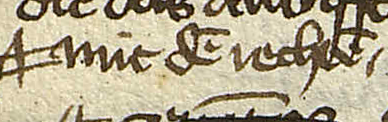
mit de* rechte* /
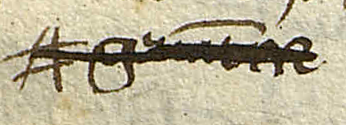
genat* N
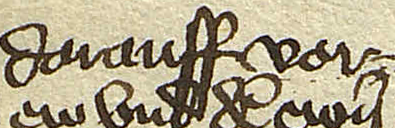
darauff vor
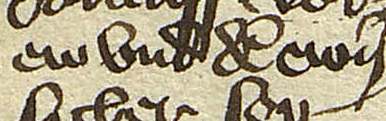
ew vnd de* ewn*
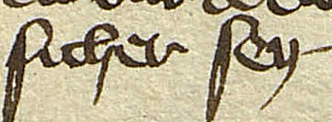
ſicher ſey
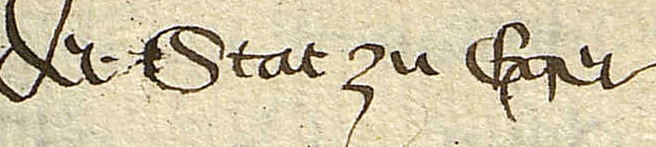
Der Stat cʒu Eger
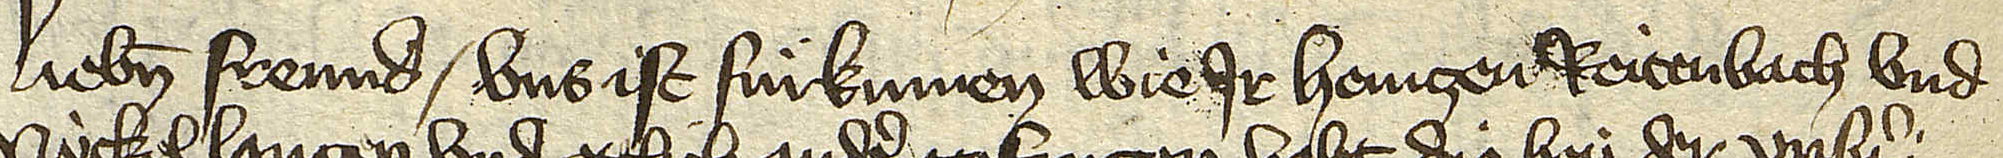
Liebn* freund / vns iſt fürkumen wie Ir heincʒen Reitenbach vnd
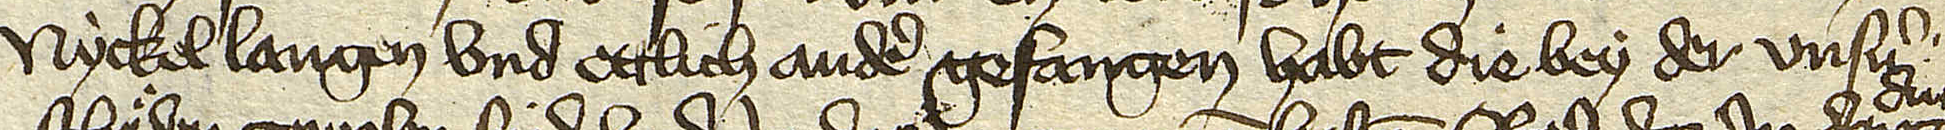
Nickel langen vnd ettlich ande* gefangen habt die bey der vnſn*
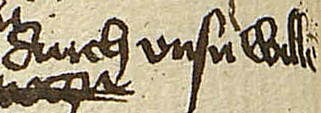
durch vnſn* wille*
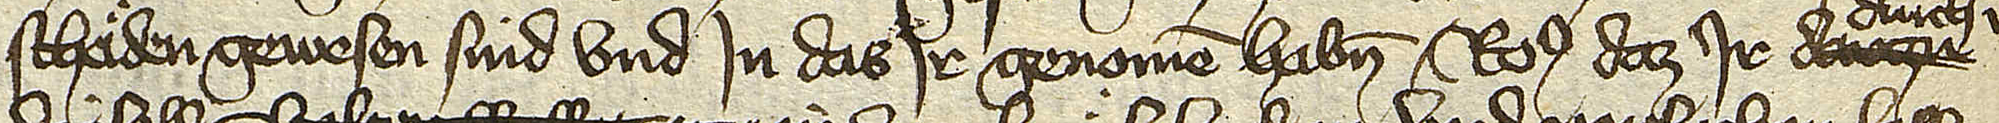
ſchëden geweſen ſind vnd In das Ir genome* habn* / Ro* daʒ Ir darcʒu
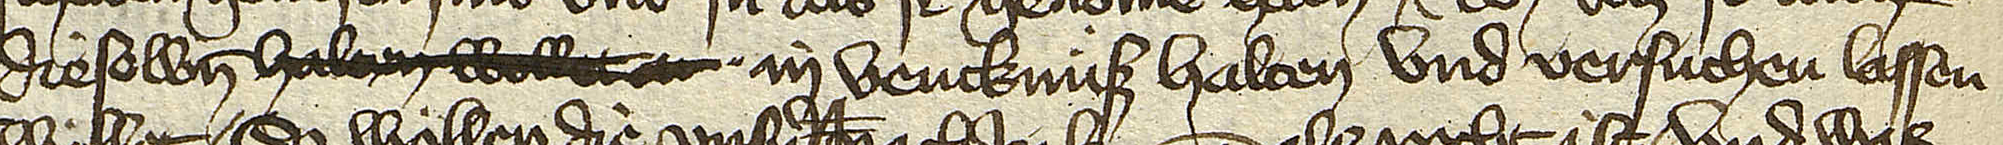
dieſelbn* halten wollet an in venknüſʒ halten vnd verſuchen laſſen
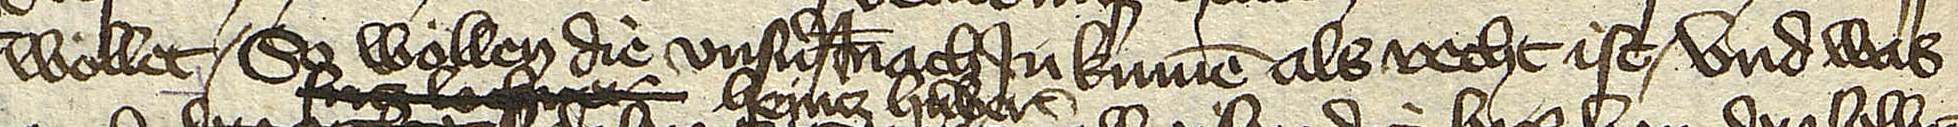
wöllet / So wöllen die vnſn* nach In kume* als recht iſt / vnd was
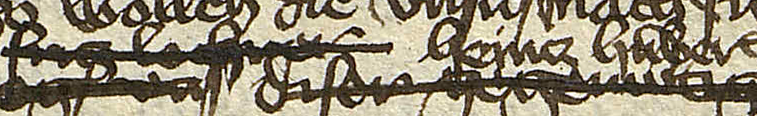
fricʒ lochner heincʒ huber*
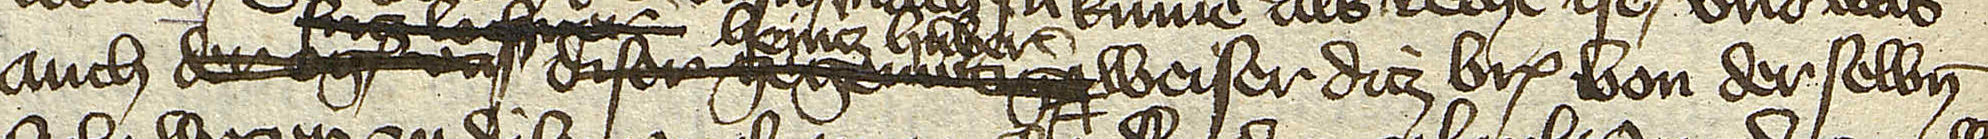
auch der og* vaſ diſer gegenw*tig weiſer dicʒ br* von der ſelbn*
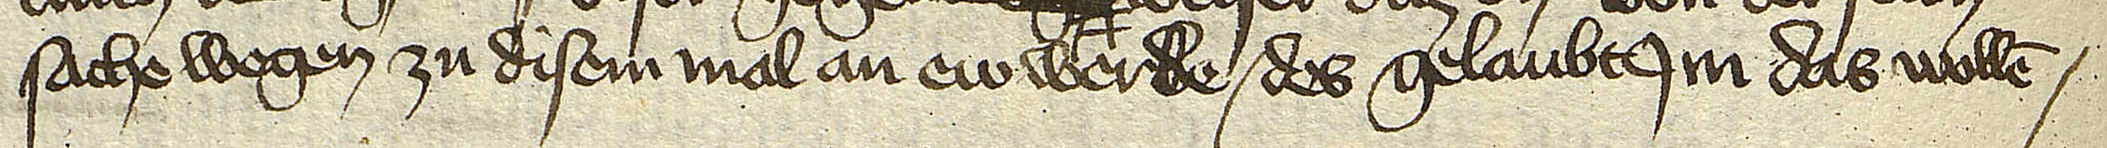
ſache wegen cʒu diſem mal an ew werbe / des gelaubt Im das wolle* /
